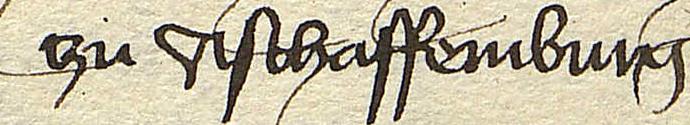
cʒu Aſchaffemburg
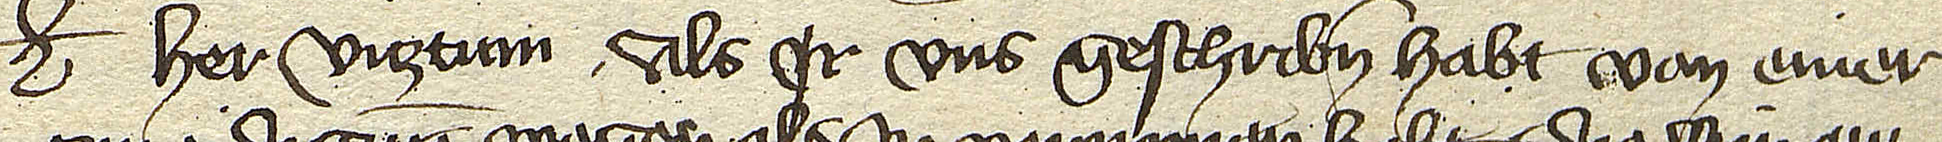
L* her vicʒtum / Als Ir vns geſchribn* habt von einer
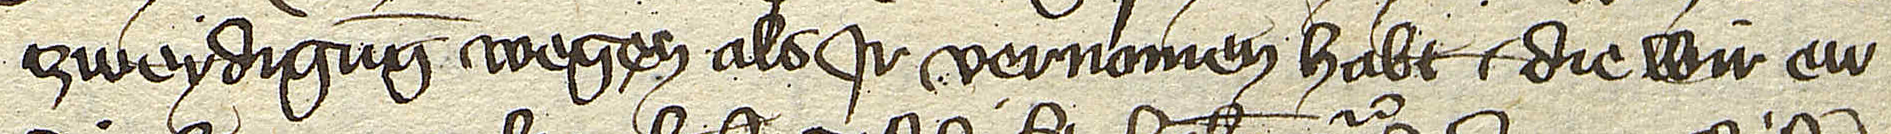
cʒweydigug* wegen als Ir vernomen habt / die wir ew
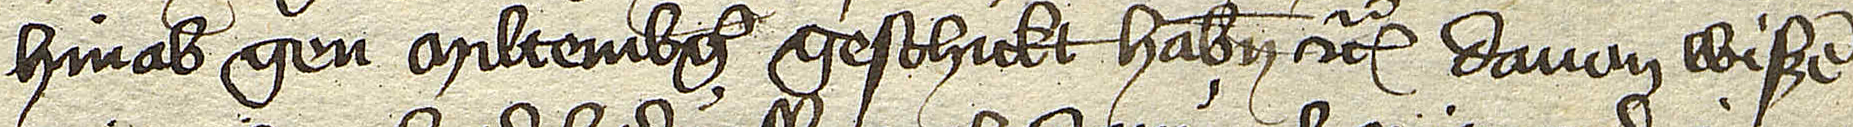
hinab gen Miltembg* geſchickt habn* ec* dauon wiſʒe*
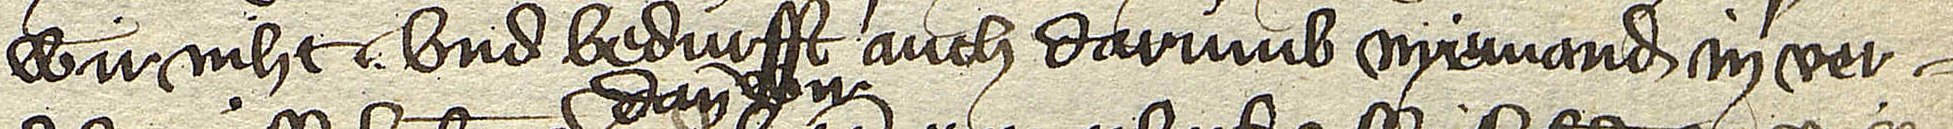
wir niht / vnd bedürfft auch darümb nyemand* in ver =
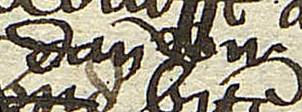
dan* wir
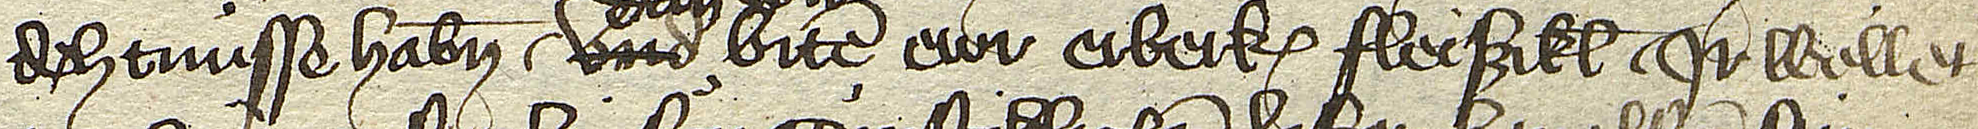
dehtnüſſe habn* / vnd bite* ewr erberk* fleiſʒikl* / Ir wöllet
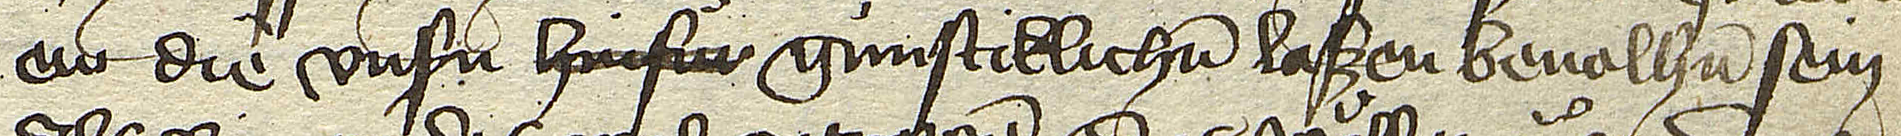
ew die vnſ*n hinfür günſticklichn* laſʒen beuolhn* ſein
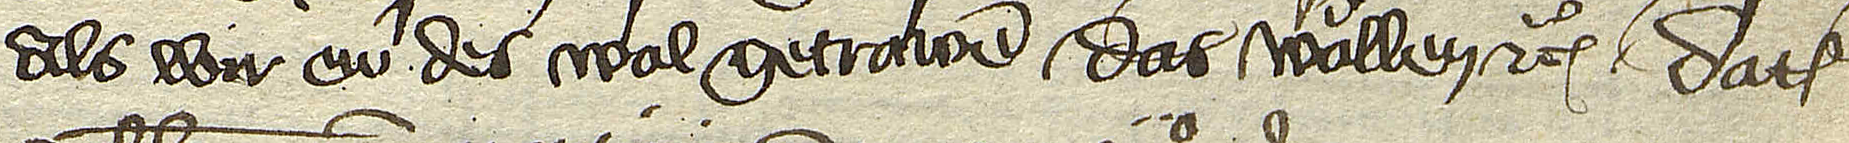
Als wir ew des wol getrawe* / das wöllen ec* / Dat*
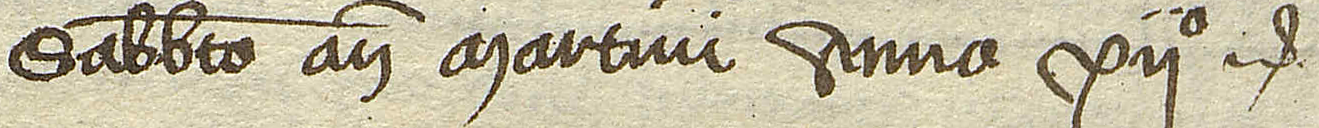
Sabbto* an* Martini Anno xii* §
